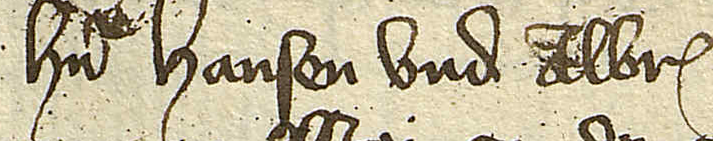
hn* hanſen vnd Albr*
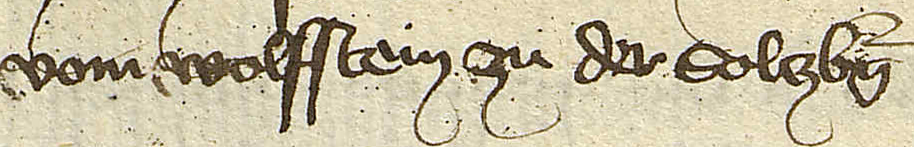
vom wolfſtein cʒu der Solcʒb*g
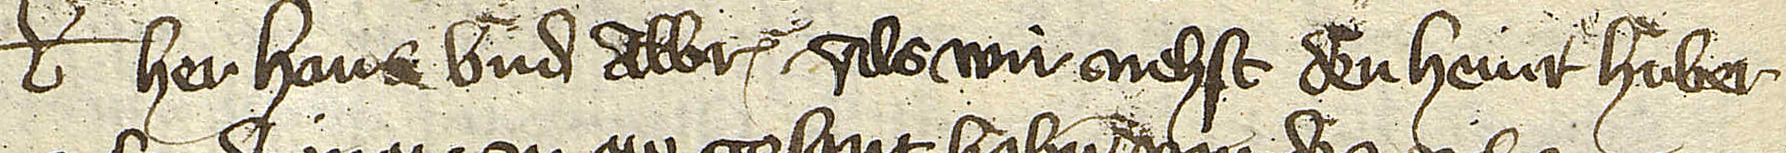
L* her hans vnd Albr* / Als wir nehſt den heinr* huber
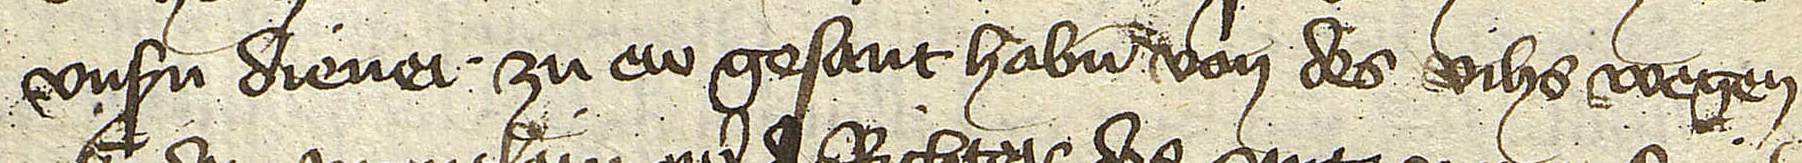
vnſ*n diener cʒu ew geſant habn* von des vihs wegen
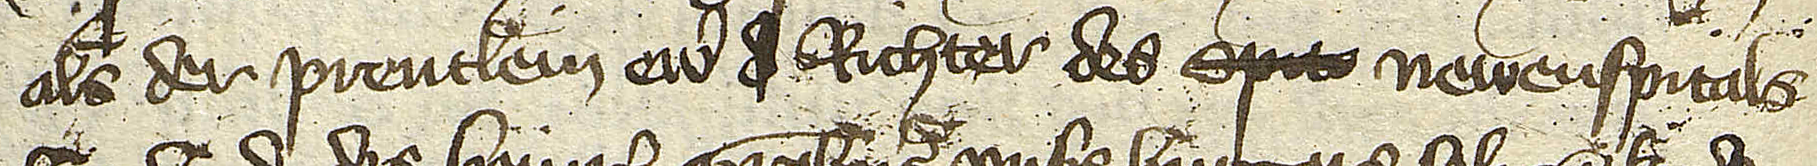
als der prentlein ew* d Richter des Spita Newenſpitals
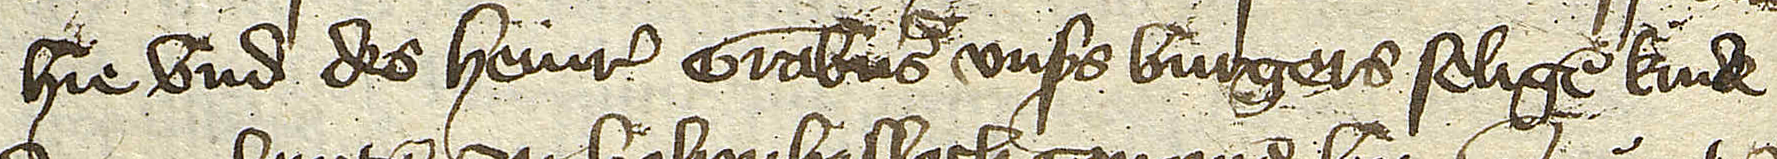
hie vnd des heinr* Grabns* vnſ*s burgers ſelige* kinde
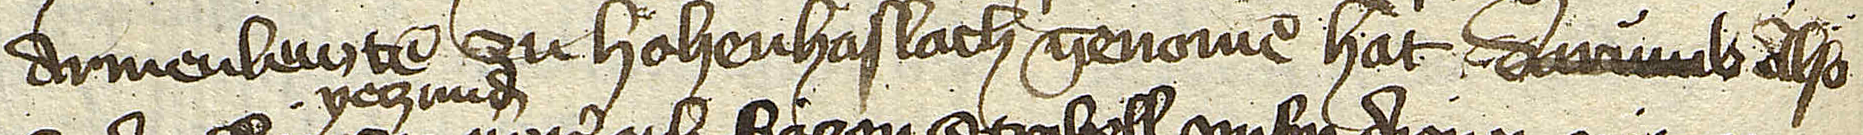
Armenlewte* cʒu hohenhaſlach genome* hat darümb Alſo
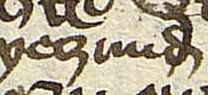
yecʒund*
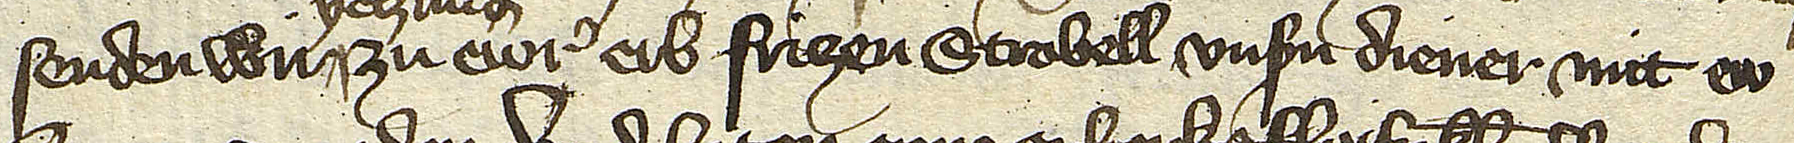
ſenden wir cʒu ewr* erb fricʒen Strobell vnſ*n diener mit ew
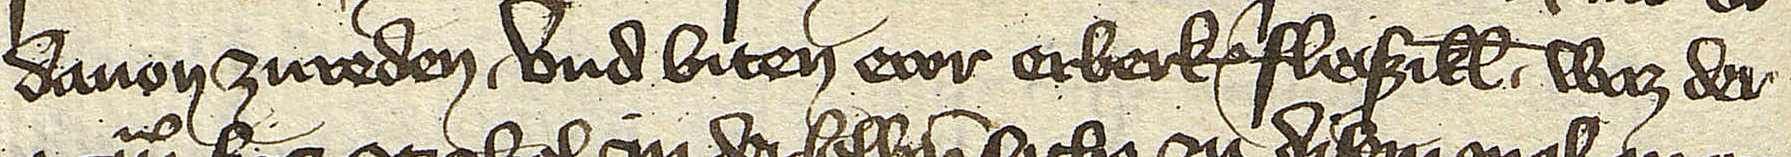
dauon cʒureden / vnd biten ewr erberk* fleiſʒikl* / waʒ der
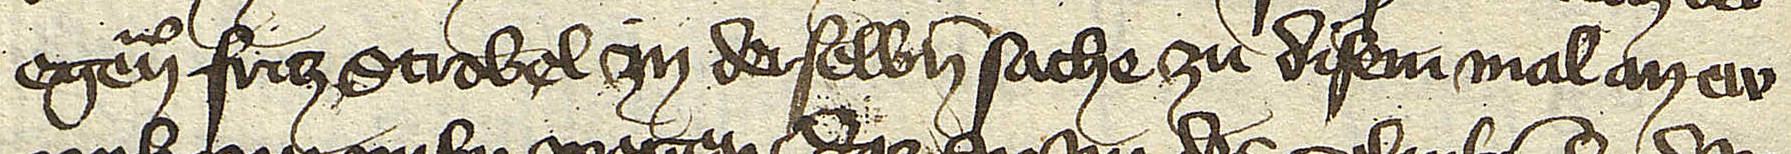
egen* fricʒ Strobel in derſelbn* ſache cʒu diſem mal an ew
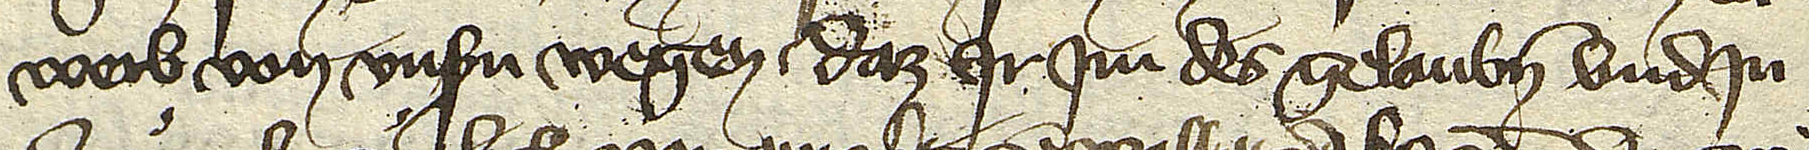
werb von vnſ*n wegen / daʒ Ir Im des gelaubn* vnd In
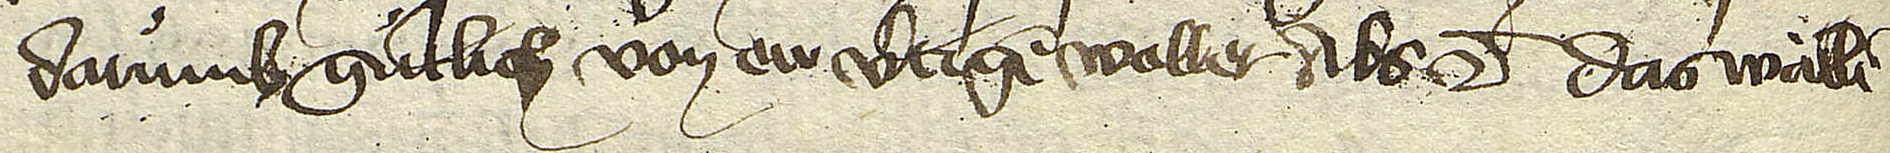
darümb gütlich von ew v*tige wollet Als ec* das wölle*
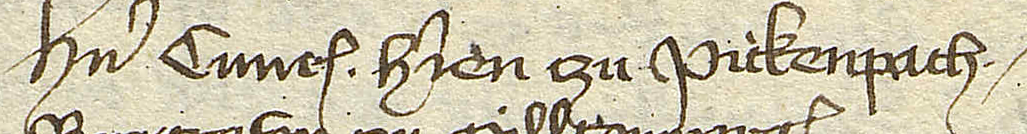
hn* Conr* h*ren cʒu Pickenpach /
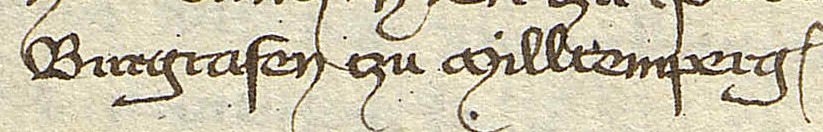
Burgrafen cʒu Milltemperg*
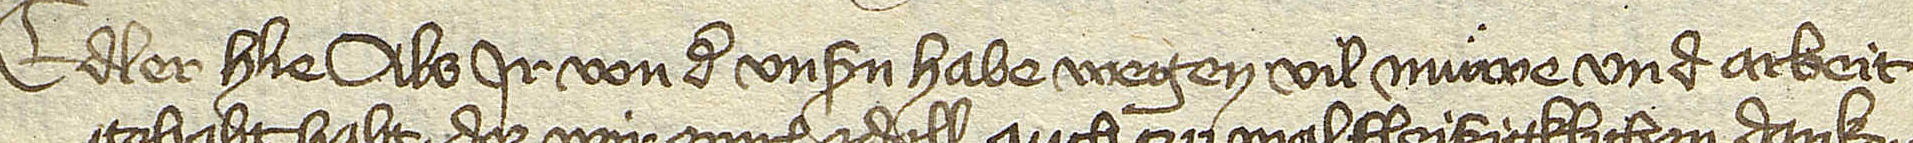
Edler h*re Als Ir von d* vnſ*n habe wegen vil müwe vnd arbeit
